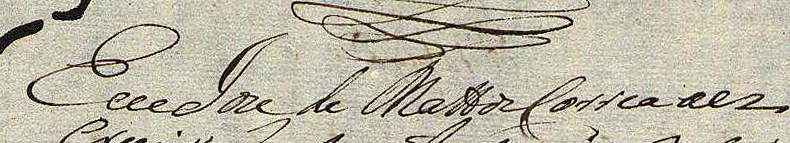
E eu Ioze de Mattoz Correa a ez
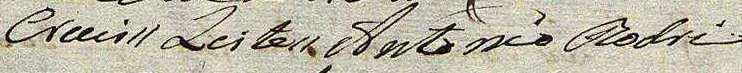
Creui// Leite// Antonio Rodri
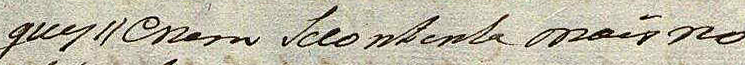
gues// e nam se contenha o mais no
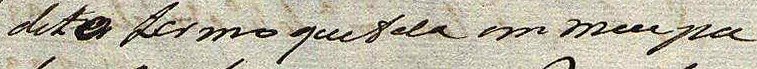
dito termo que feca em meu pu
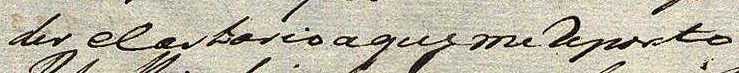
der e cartorio a que me Reporto
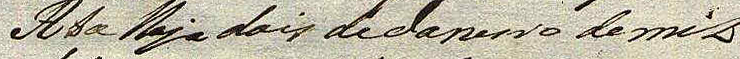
Atallaja dois de Ianeiro de miL
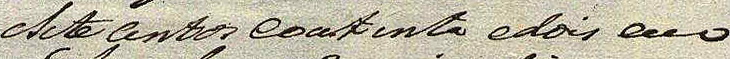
e setecentos e outenta e dois e eu
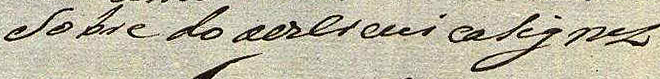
sobredo a escreui e asignei
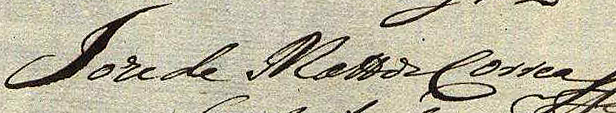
Ioze de Mattoz Correa
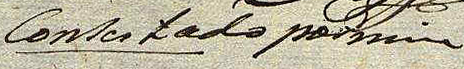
Consertado por mim
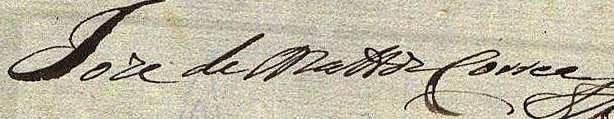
Ioze de Mattoz Correa
